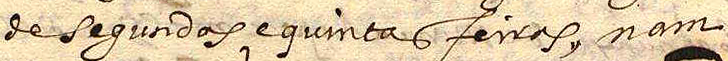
de segundas e quintas feiras, nam
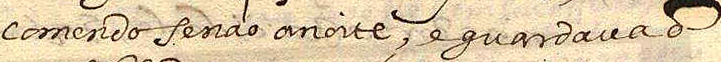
comendo senão a noite, e guardauaõ
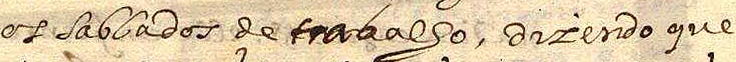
os sabbados de trabalho, dizendo que
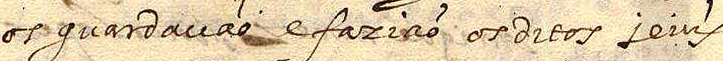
os guardauaõ e faziaõ os ditos jeiūs
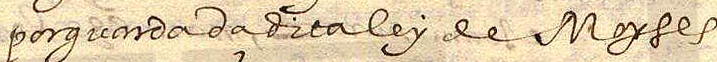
por guarda da dita ley de Moyses
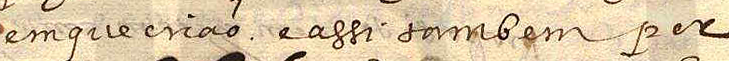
em que criaõ e assim tambem per
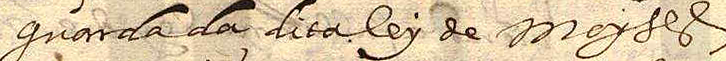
guarda da dita ley de moyses
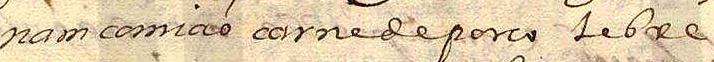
nam comiaõ carne de porco Lebre
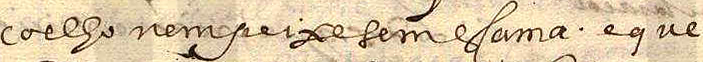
coelho nem peixe sem esCama. e que
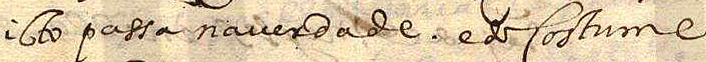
isto passa na uerdade e do Costume
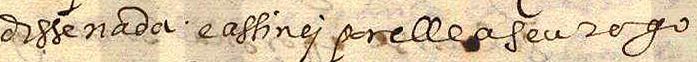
disse nada e assinej por elle a seu rogo
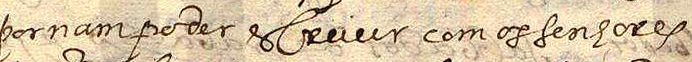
por nam poder esCreuer com os senhores
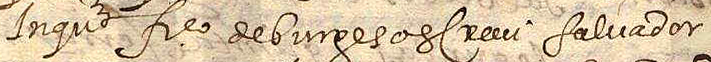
Inqures fr.co de burges o esCreui saluador
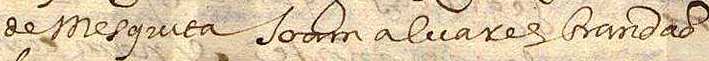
de mesquita Ioam aluares brandaõ
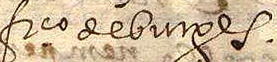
fr.co de burges.
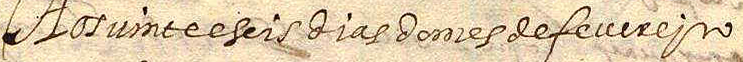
Aos uinte e seis dias do mes de feuerejro
